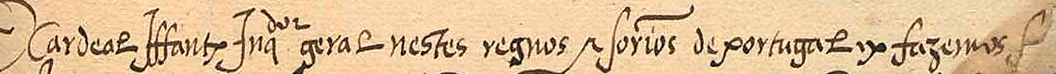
Cardeal Jffantꝭ Jnqdor geraL nestes regnos e sor̄ios de portugaL cꝭ fazemos
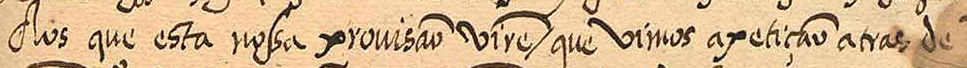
Aos que esta nossa prouisão virē que vimos a petição atras de
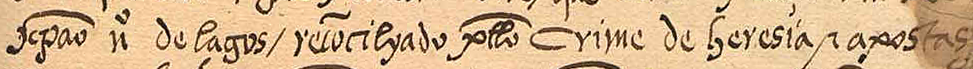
x̄pao no de lagos / recōcilyado p̄llo crime de heresia e apostas
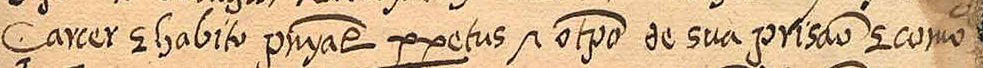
carcer E habito pn̄yaL ꝑpetus e o t̄po de sua prisão E como
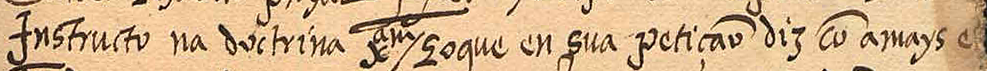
Jnstructo na doctrina xam / E o que en sua petição diz cō a mays e
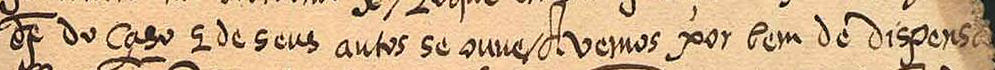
t̄e do caso E de seus autos se ouue / Avemos por bem de dispensa
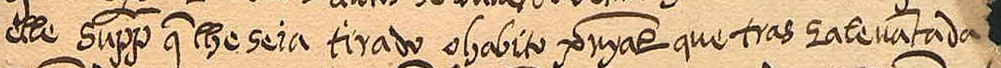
elle suppte q̄ lhe seia tirado o habito p̄nyaL que tras E aleuātada
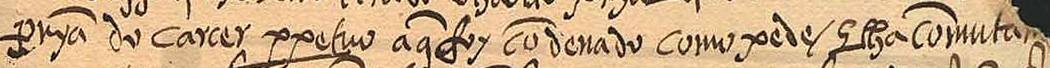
pn̄ya do carcer ꝑpetuo a q̄ foy cōdenado como pede / E lha cōmuta
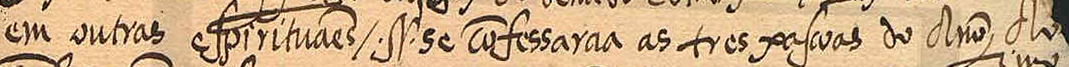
em outras espirituāes / .ss. se cōfessaraa as tres pascoas do An̄o Ao
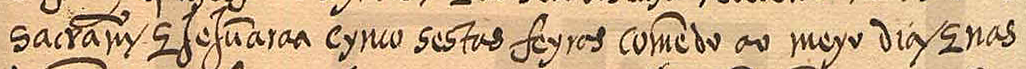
sacramto / E JeJūaraa cynco sestas feyras com̄edo ao meyo dia / E nas
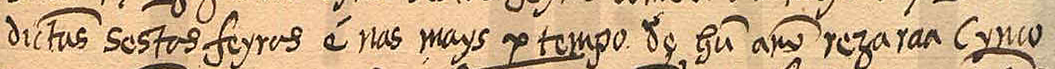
dic̄tas sestas feyras e nas mays ꝑ tempo de hū an̄o rezaraa cynco
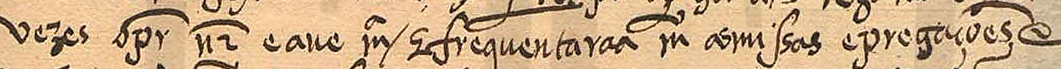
vezes o p̄r n̄r e aue ma / E frequentaraa mto as missas e pregações cō
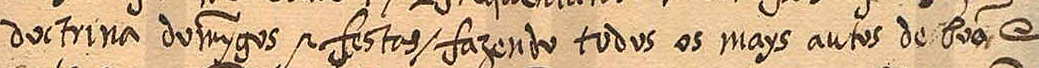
doctrina dom̄ygos e festas / fazendo todos os mays autos de bōo e
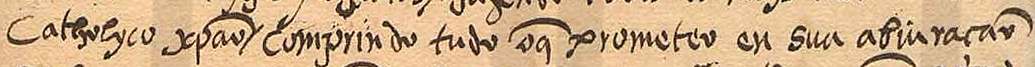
catholyco xp̄ao / comprindo tudo o q̄ prometeo en sua abiuraçaõ
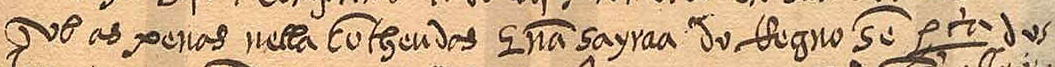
sob as penas nella cōtheudas E nā sayraa do Regno sē Lça dos
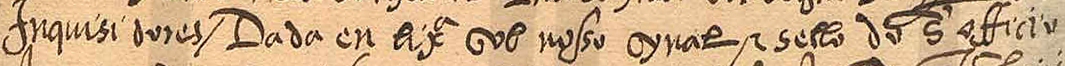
Jnquisidores / Dada en lixa sob nosso synal e sello do sto officio
